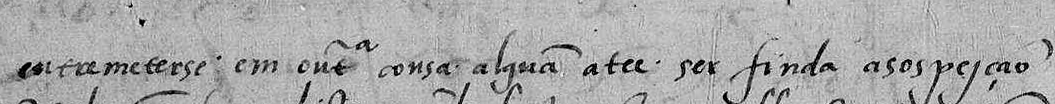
entremeterse em outra cousa alguā atee. ser finda a sospejçaõ
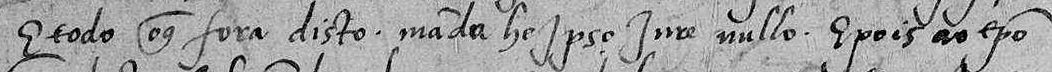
E todo o q̄ fora disto. māda he Jpso Jure nullo. E pois ao tpō
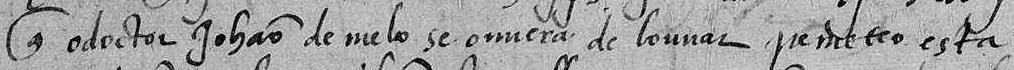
q̄ o doctor Johaõ de melo se ouuera de louuar remeteo esta
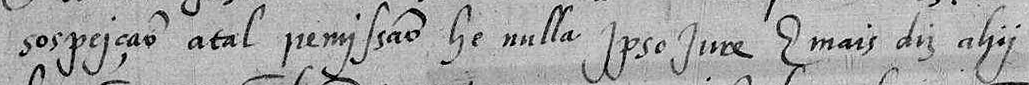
sospejção a tal remjssão he nulla Jpso Jure E mais diz a hij
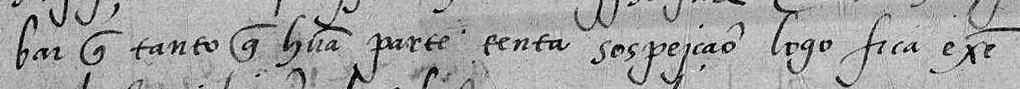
bar q̄ tanto q̄ hūa parte tenta sospejção logo fica exē
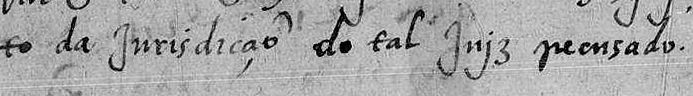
to da Jurisdiçaõ do tal Jujz recusado.
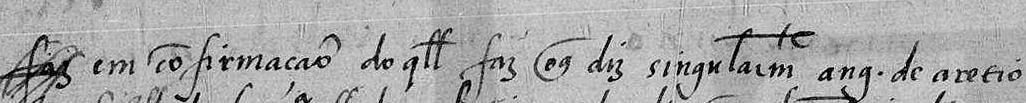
faz em c̄ofirmaçaõ do q̄ll faz o q̄ diz singularmte ang. de aretio
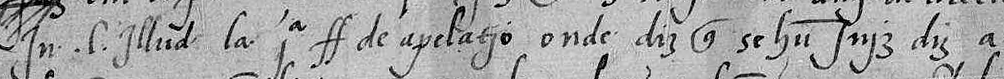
Jn .l. Jllud la ja ff de apelatjo onde diz q̄ se hū Jujz diz a
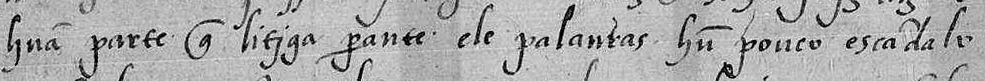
hūa parte q̄ litjga ꝑante ele palauras hū pouco escādalo
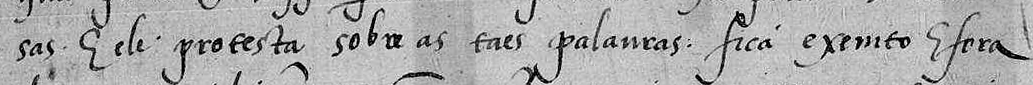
sas E ele protesta sobre as taes palauras. fica exemto E fora
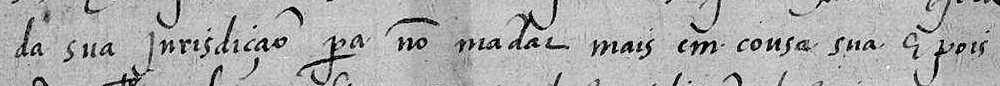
da sua Jurisdiçaõ ꝑa n̄o mādar mais em cousa sua E pois
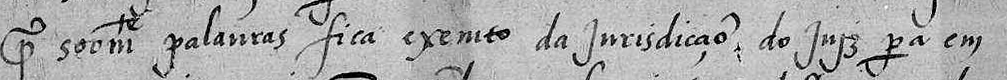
p̄o soomte palauras fica exemto da Jurisdiçaõ do Jujz ꝑa em
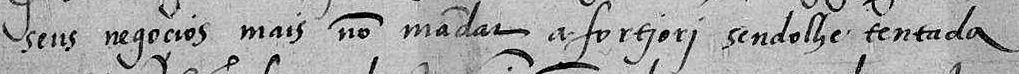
seus negocios mais n̄o mādar a fortjorj sendolhe tentada
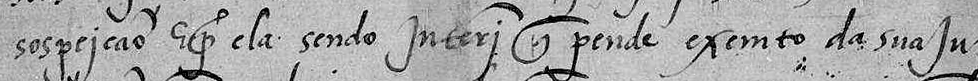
sospejçaõ E p̄o ela sendo Jnterj̄ q̄ pende exemto da sua Ju
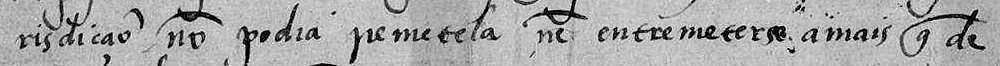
risdiçaõ n̄o podia remetela nē entremeterse a mais q̄ de
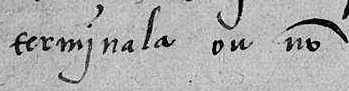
termjnala ou n̄o
